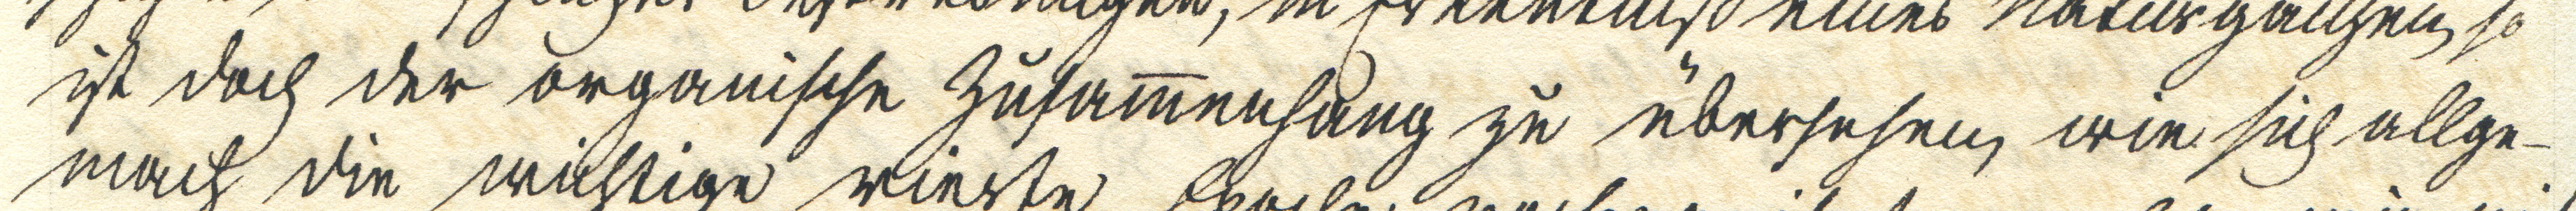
ist doch der organische Zusam̃enhang zu übersehen, wie sich allge-
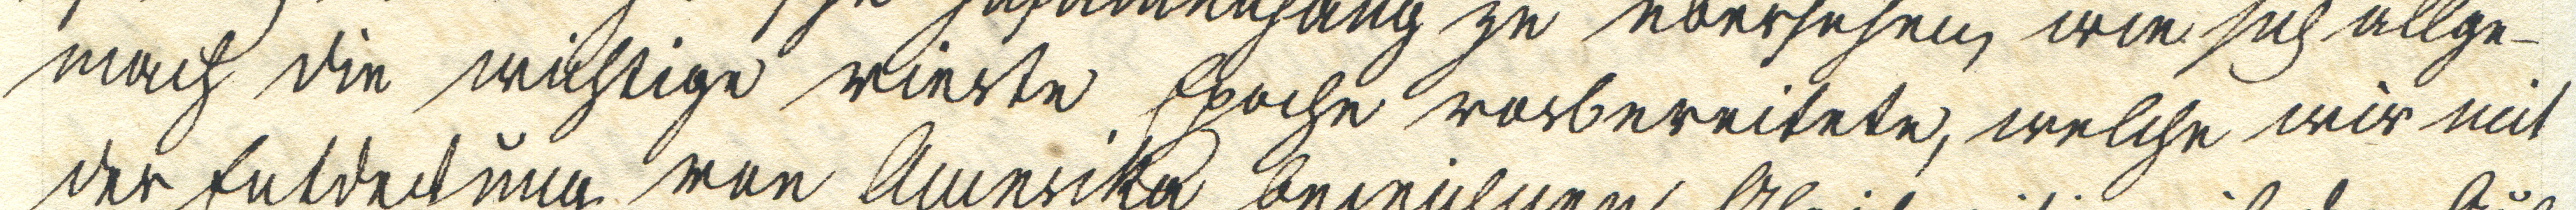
mach die wichtige vierte Epoche vorbereitete, welche wir mit
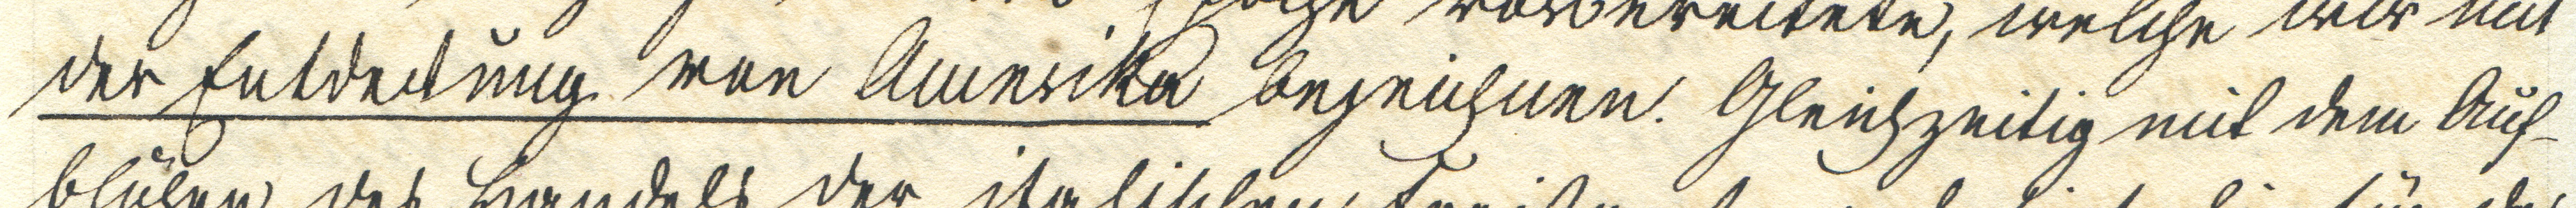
der Entdeckung von Amerika bezeichnen. Gleichzeitig mit dem Auf-
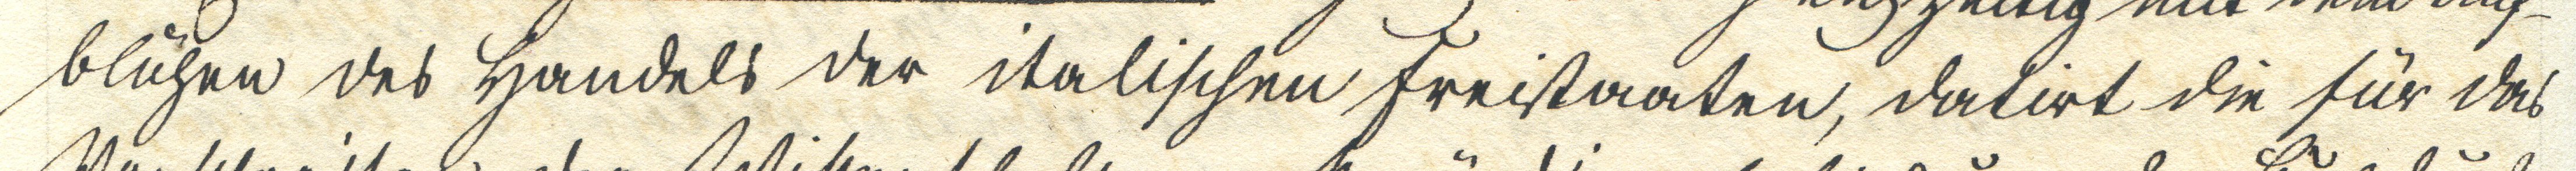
blühen des Handels der italienischen Freistaaten, datirt die für das
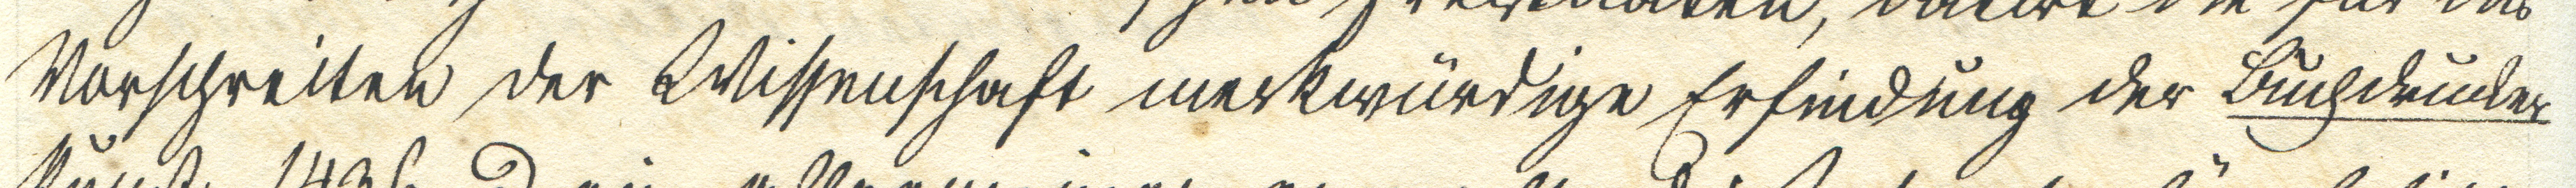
Vorschreiten der Wissenschaft merkwürdige Erfindung der Buchdrucker
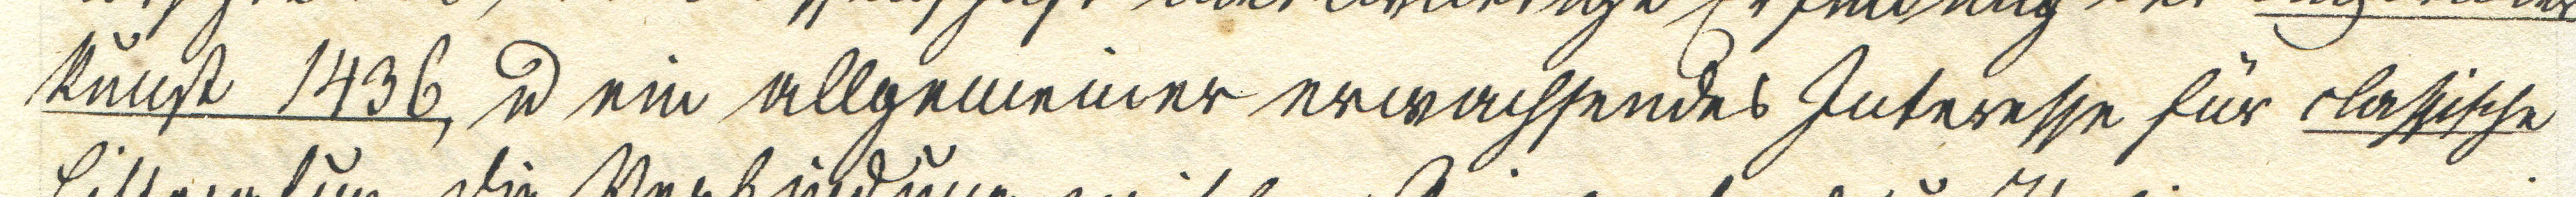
kunst 1436, u ein allgemeiner erwachsendes Interesse für die classische
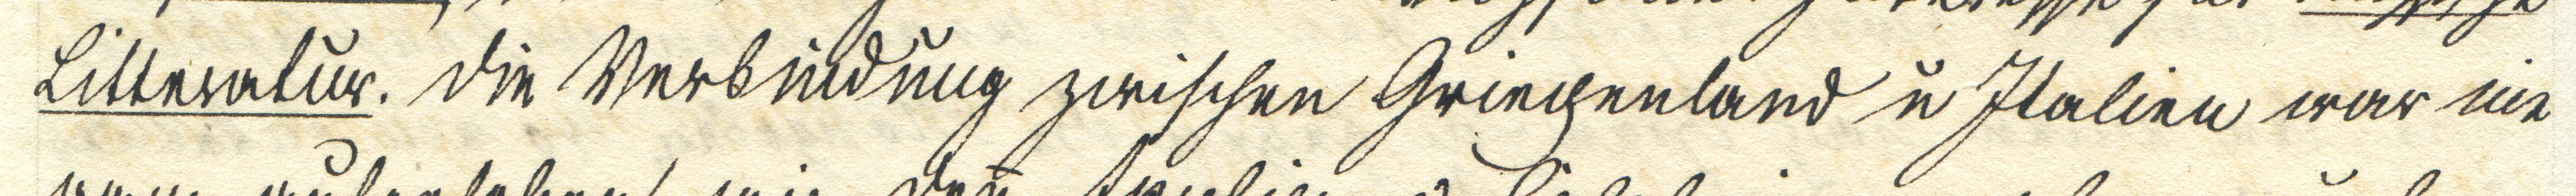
Litteratur. Die Verbindung zwischen Griechenland u Italien war nie
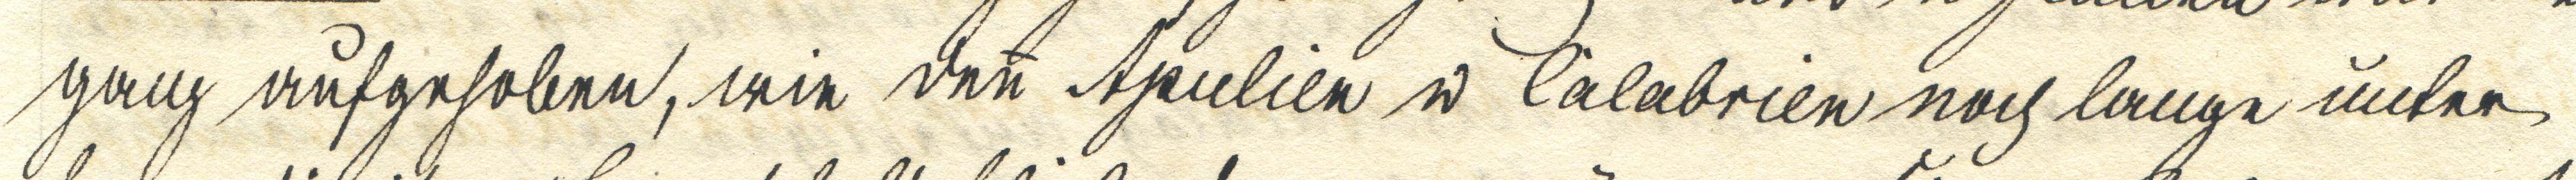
ganz aufgehoben, wie deñ Apulien u Calabrien noch lange unter
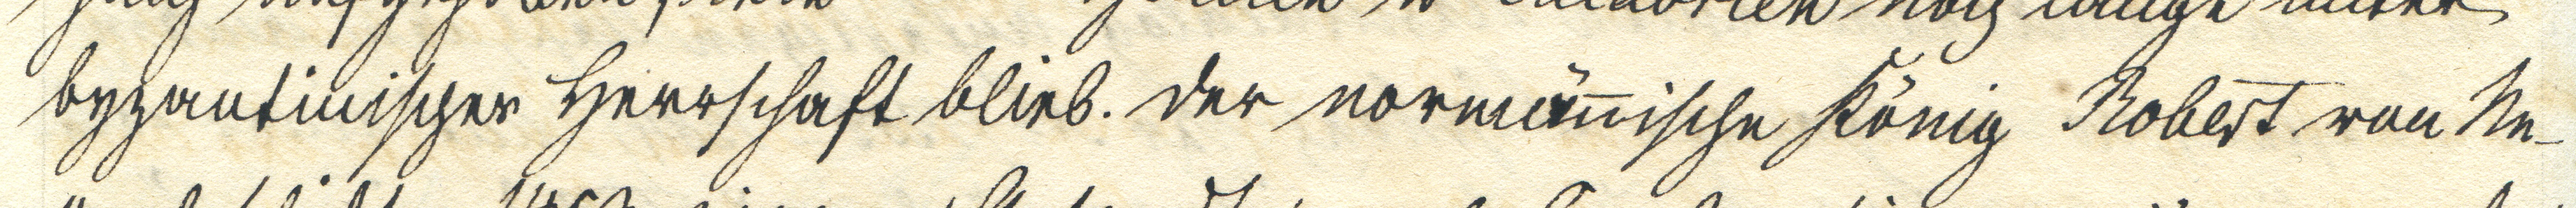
byzantinischer Herrschaft blieb. Der normäñische König Robert von Ne-
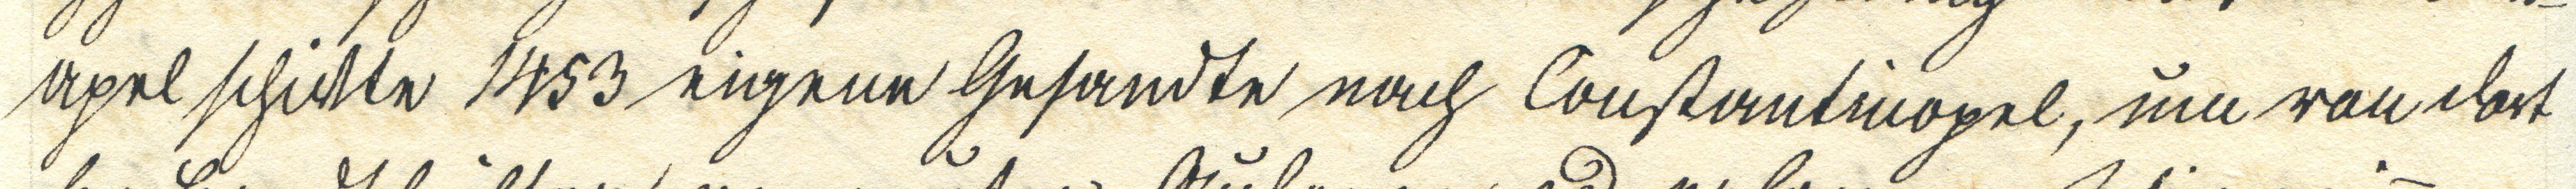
apel schickte 1453 eigene Gesandte nach Constantinopel, um von dort
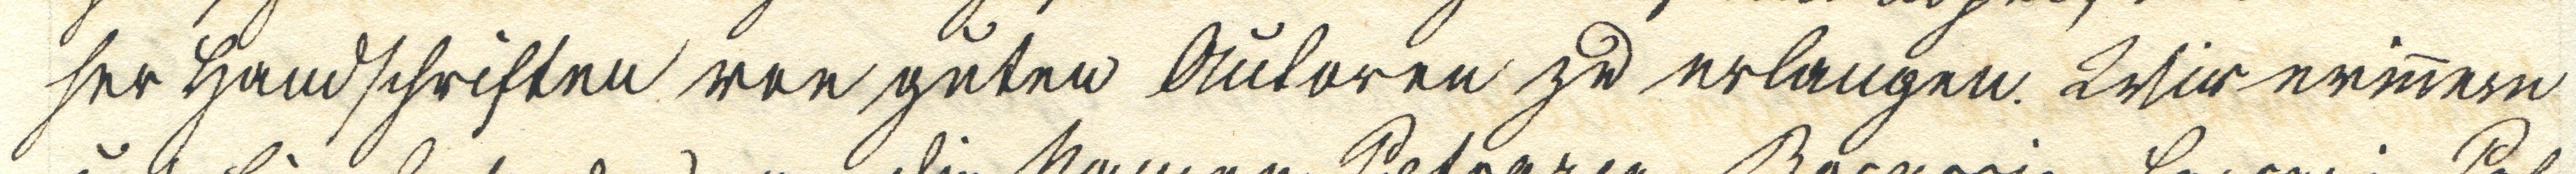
her Handschriften von guten Autoren zu erlangen. Wir eriñern
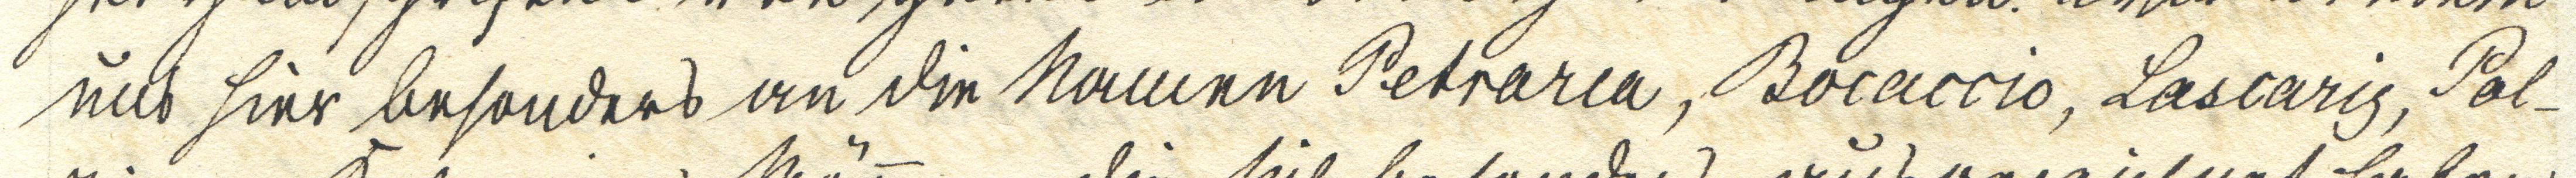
uns hier besonders an die Namen Petrarca, Bocaccio, Lascaris, Pol-
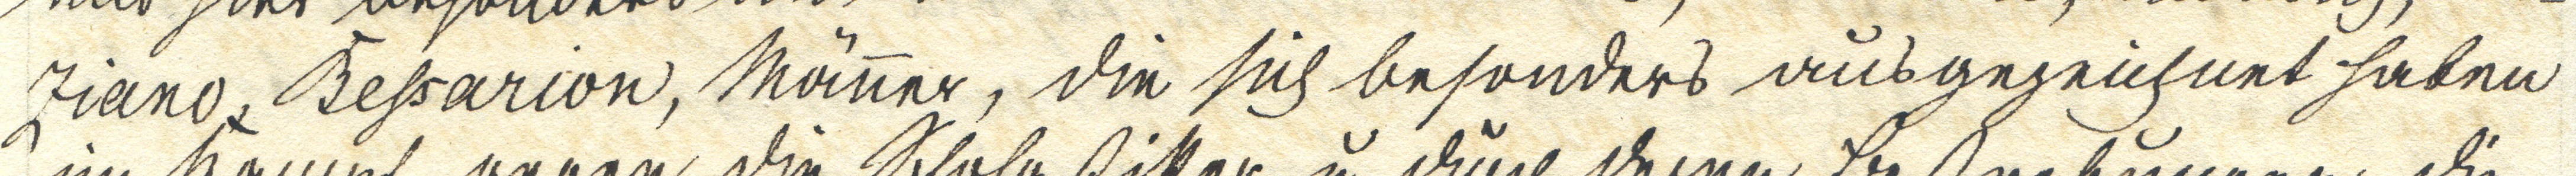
ziano, Bessarion Mäñer, die sich besonders ausgezeichnet haben
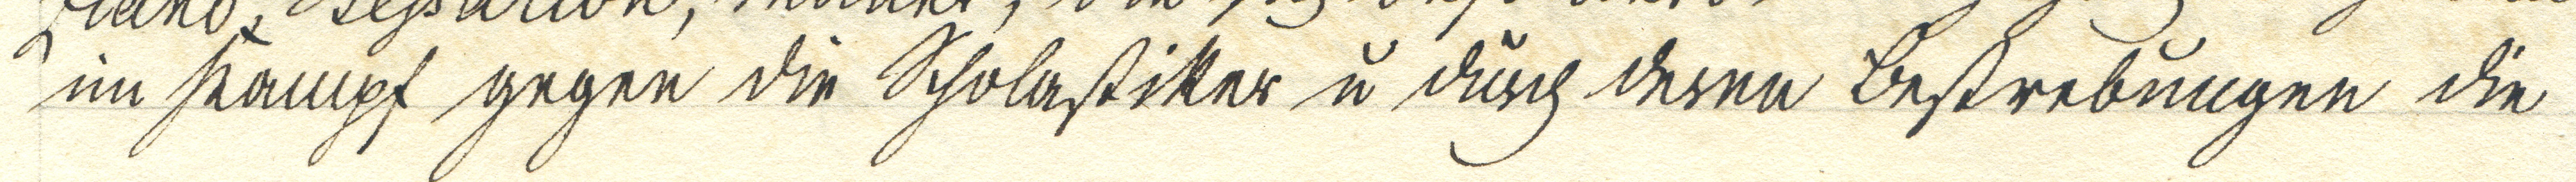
im Kampf gegen die Scholastiker u durch deren Bestrebungen die
